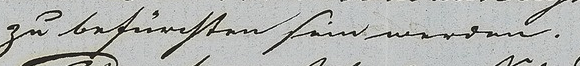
zu befürchten sein werden. –
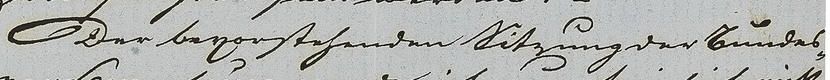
Der bevorstehenden Sitzung der Bundes-
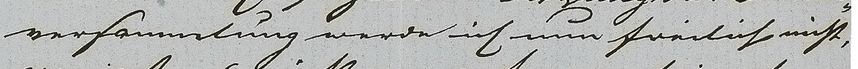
versammlung werde ich nun freilich nicht,
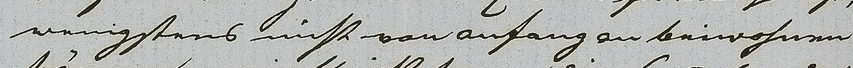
wenigstens nicht von anfang an beiwohnen
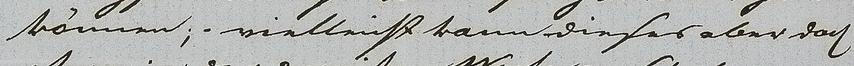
können; – vielleicht kann dieses aber doch
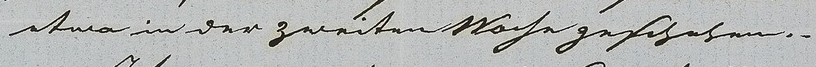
etwa in der zweiten Woche geschehen. –
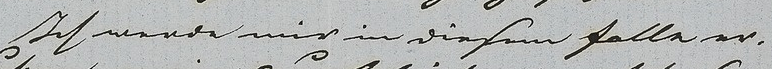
Ich werde mir in diesem Falle er-
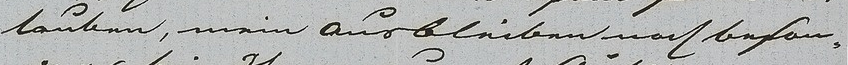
lauben, mein Ausbleiben noch beson-
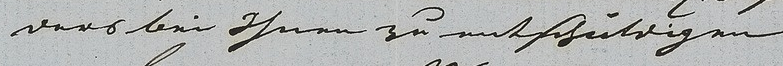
ders bei Ihnen zu entschuldigen
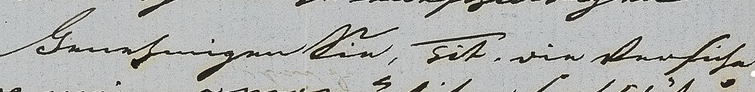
Genehmigen Sie, Tit. die Versiche-
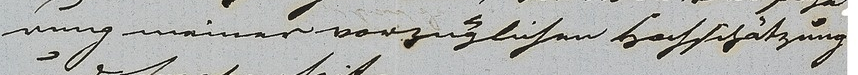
rung meiner vorzüglichen Hochschätzung
